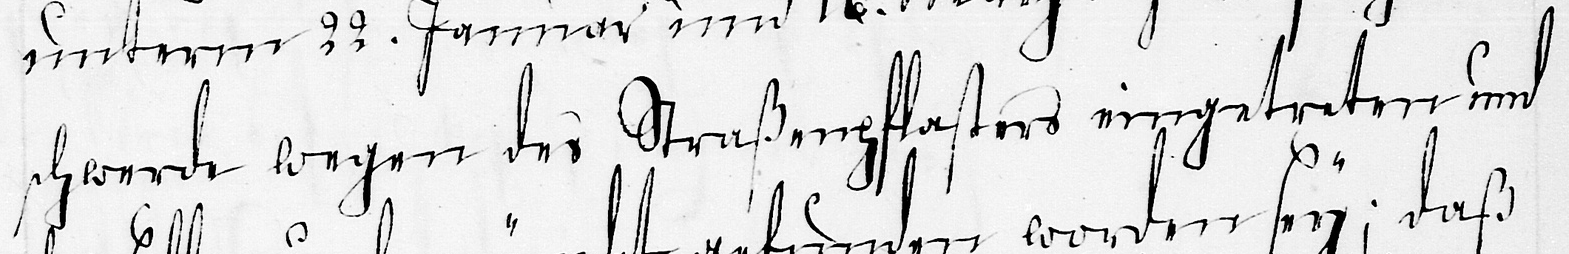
schwerde wegen des Straßenpflasters eingetreten und
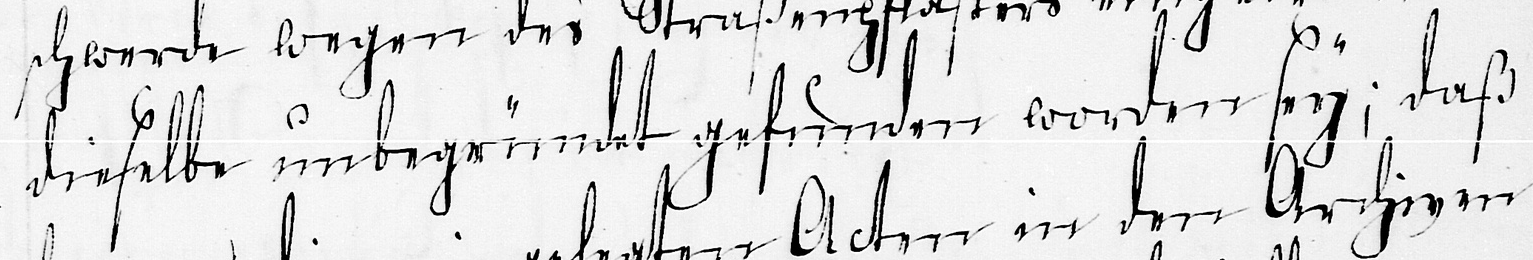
dieselbe unbegründet gefunden worden sey; daß
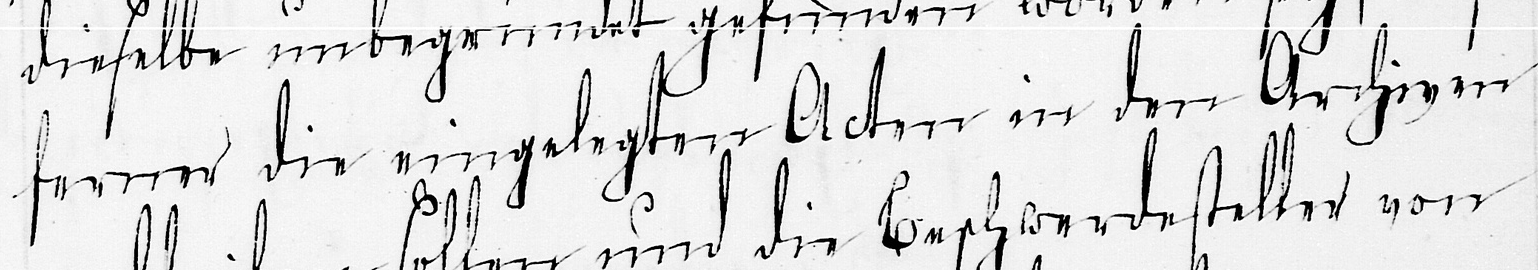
ferner die eingelegten Acten in den Archiven
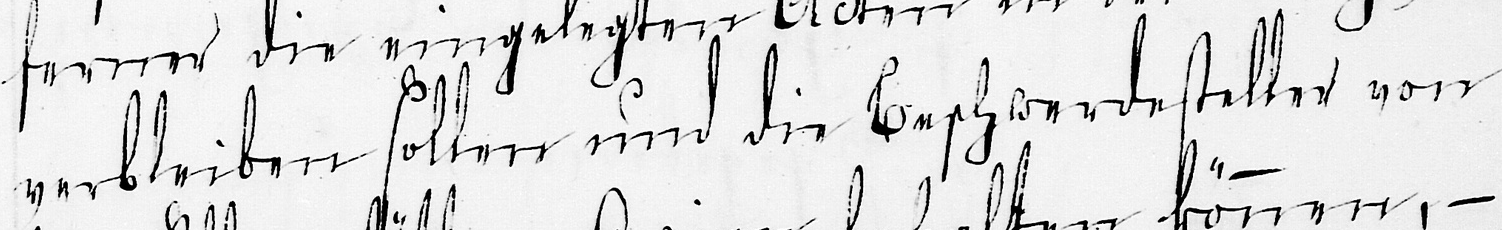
verbleiben sollen und die Beschwerdesteller von
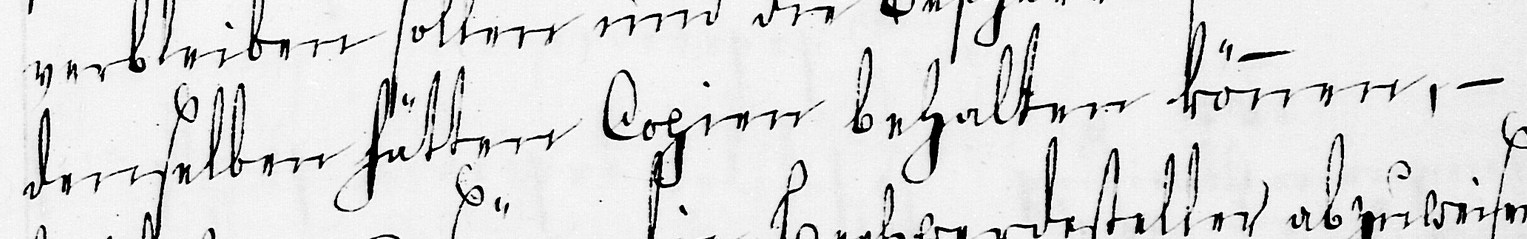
denselben hätten Copien behalten können, –
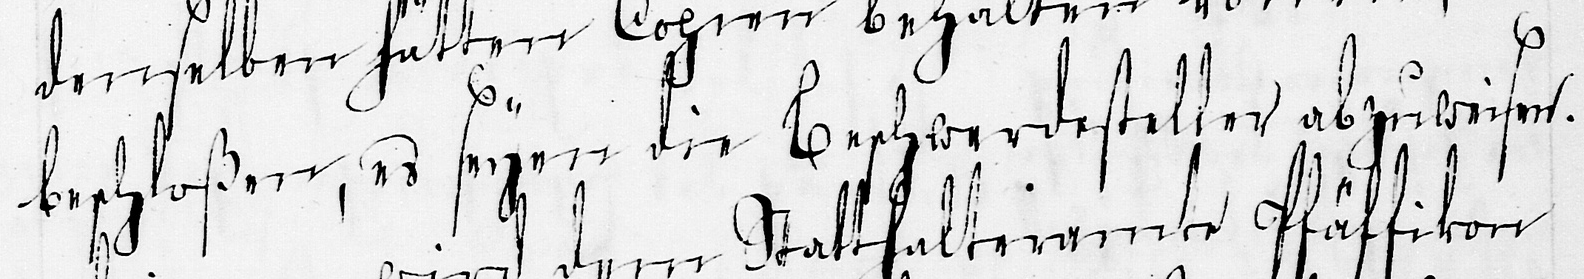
beschloßen, es seyen die Beschwerdesteller abzuweisen.
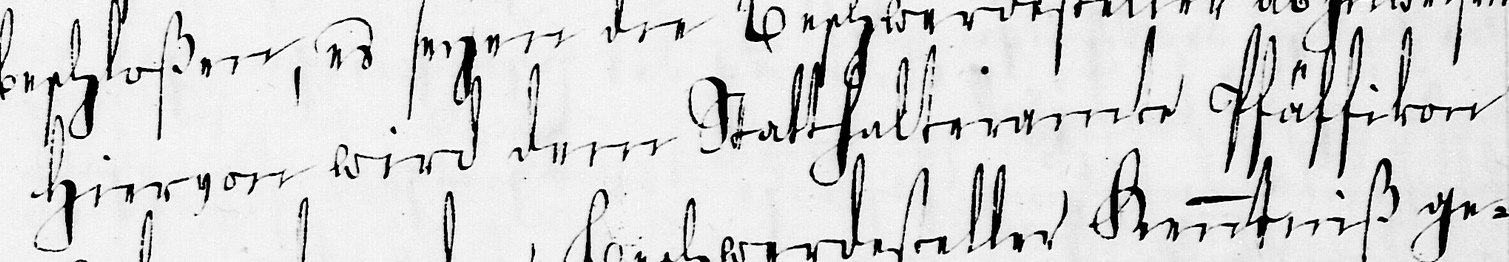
Hiervon wird dem Statthalteramte Pfäffikon
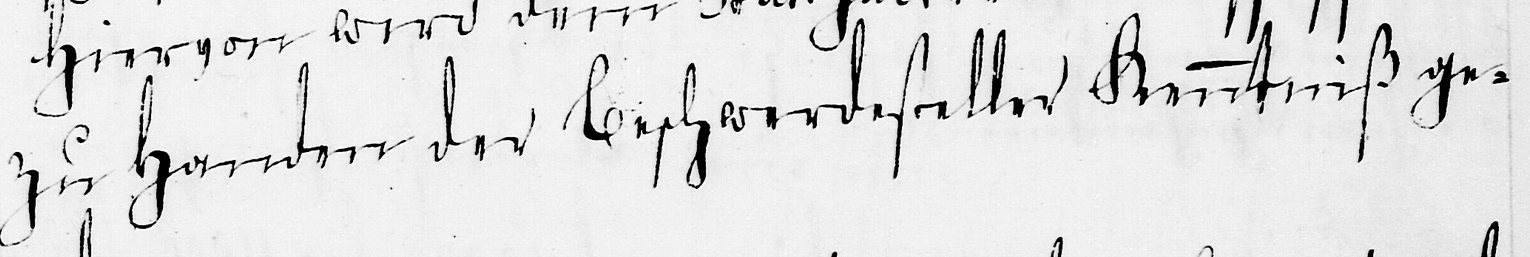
zu Handen der Beschwerdesteller Kenntniß ge¬
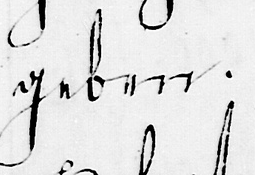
geben.
